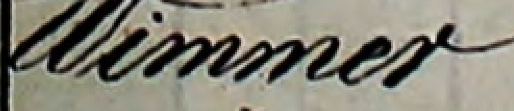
Wimmer
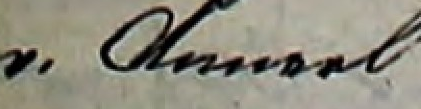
v. Annerl
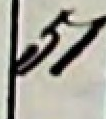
51
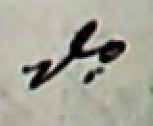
Do
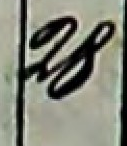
28
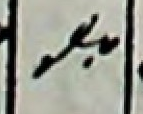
Do
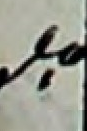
Do
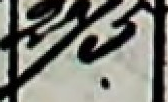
275
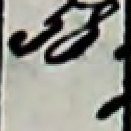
58
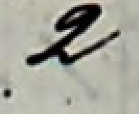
2
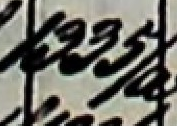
1335/a
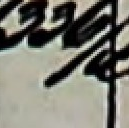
1336/a
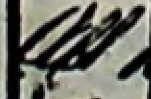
Alt
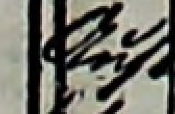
Aus
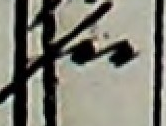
see
